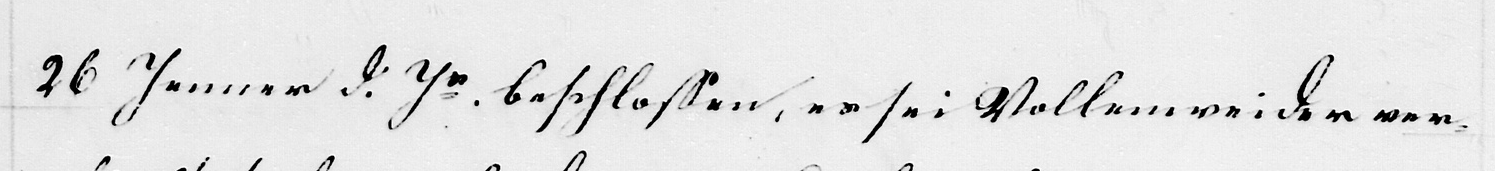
26 Januar d. Js. beschloßen, es sei Vollenweider ver¬
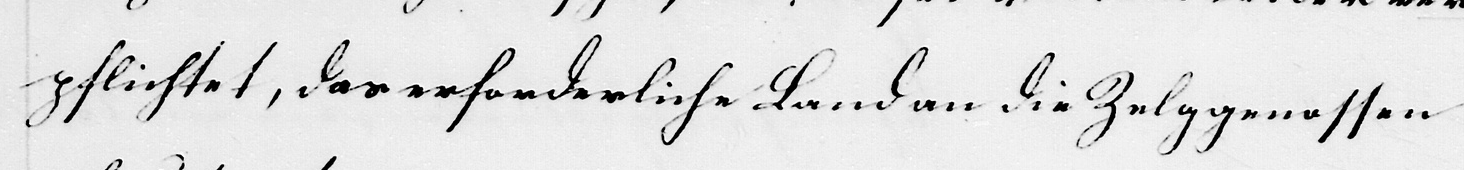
pflichtet, das erforderliche Land an die Zelggenossen
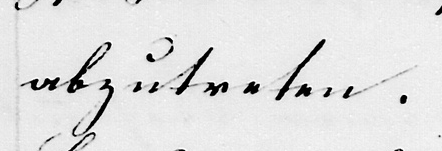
abzutreten.
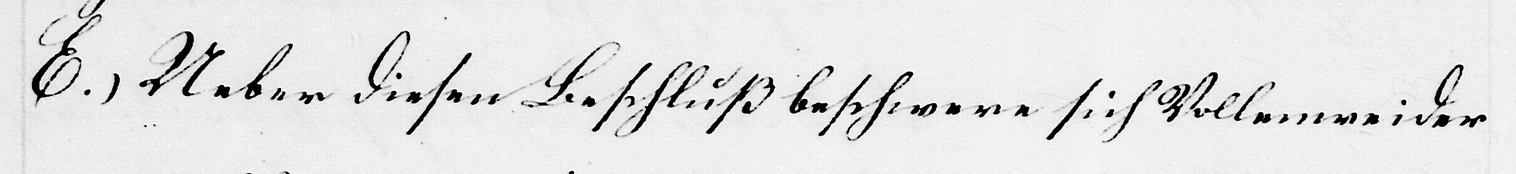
E.) Ueber diesen Beschluß beschwere sich Vollenweider
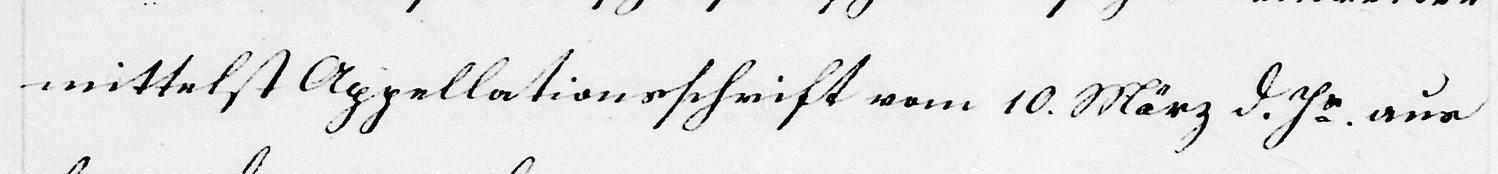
mittelst Appellationsschrift vom 10. März d. Js. aus
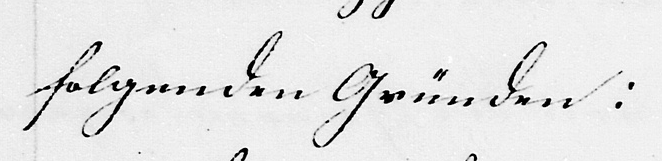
folgenden Gründen:
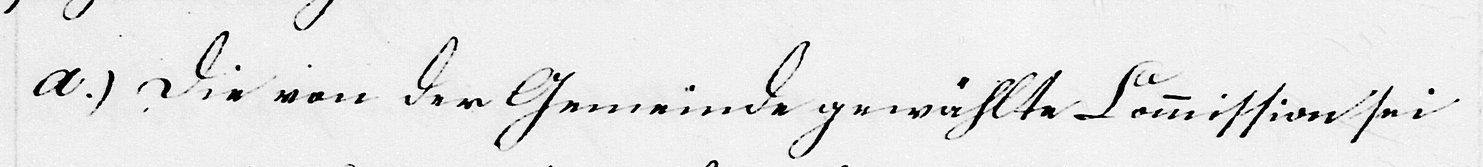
a.) Die von der Gemeinde gewählte Commission sei
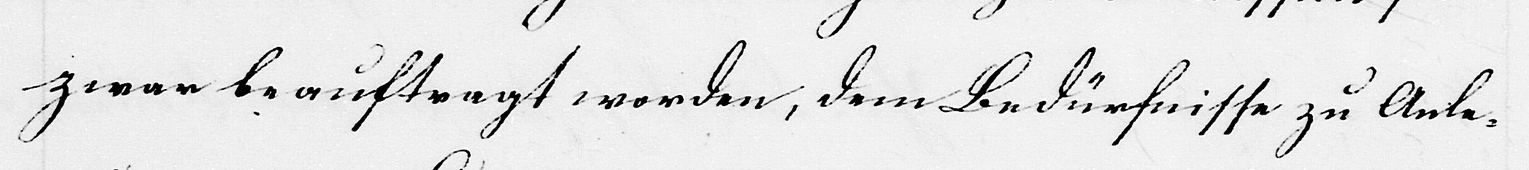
zwar beauftragt worden, dem Bedürfnisse zu Anle¬
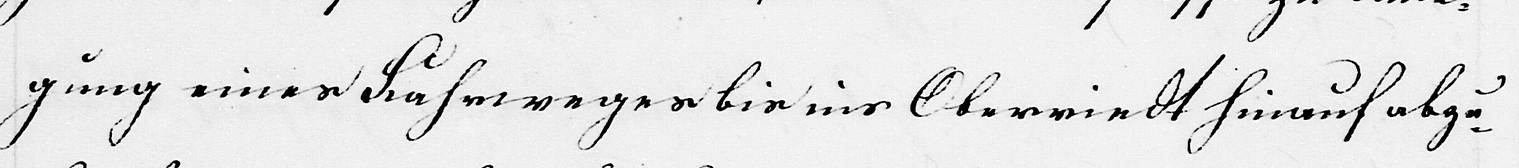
gung eines Fahrweges bis ins Oberriedt hinauf abzu¬
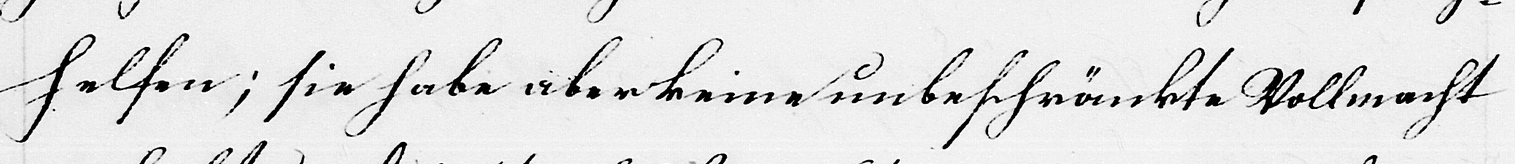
helfen; sie habe aber keine unbeschränkte Vollmacht
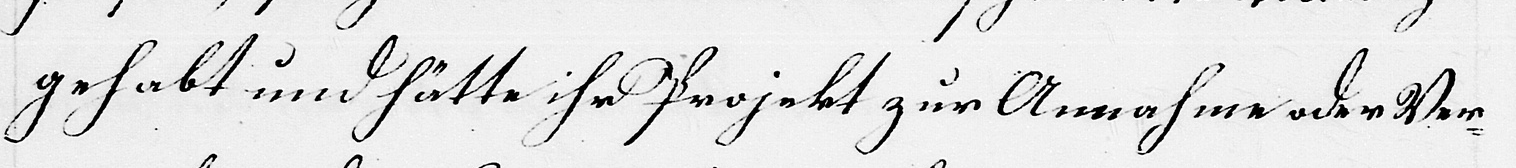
gehabt und hätte ihr Projekt zur Annahme oder Ver¬
